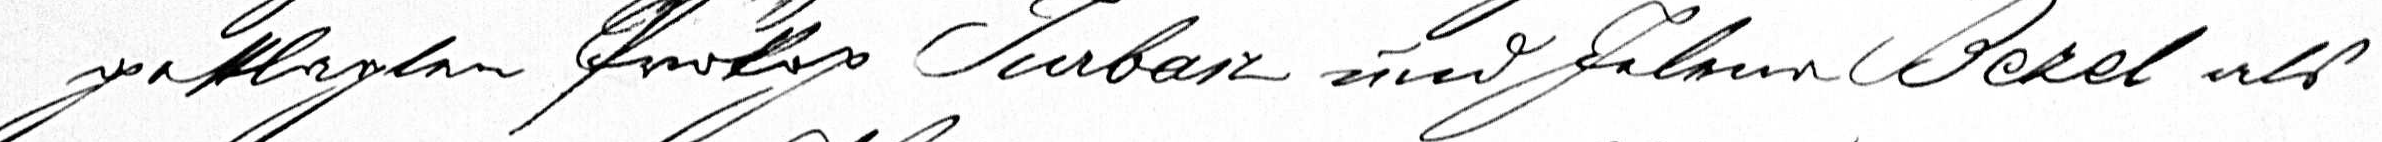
geklagten Prokop Iurbasz und Jelena Bezel als
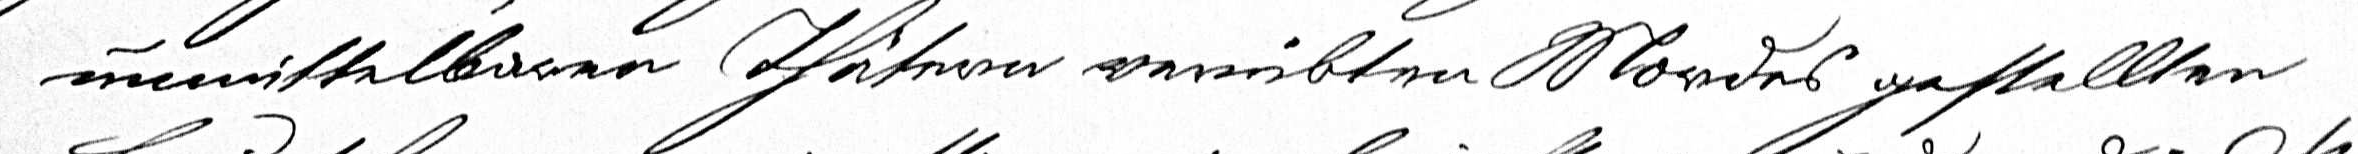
unmittelbaren Thätern verübten Mordes gestellten
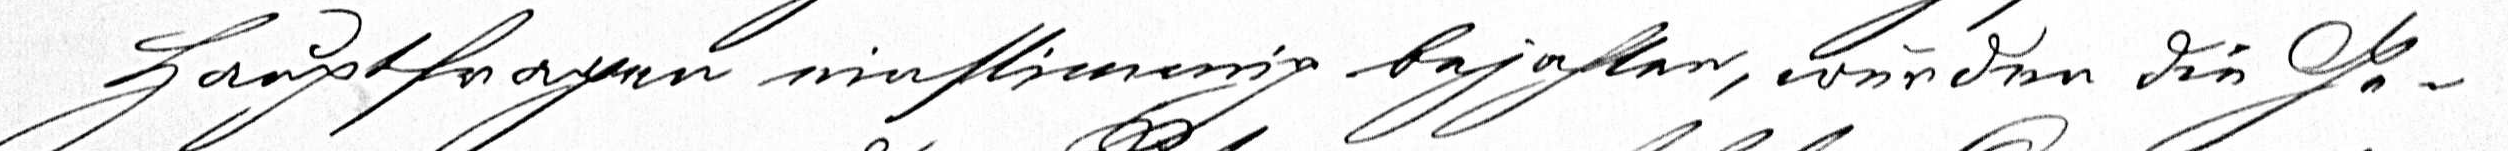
Hauptfagen einstimmig bejahten, wurden die Ge¬
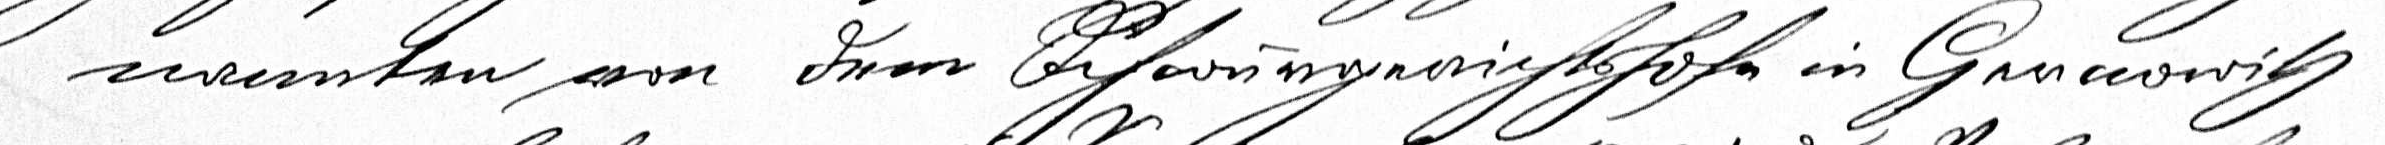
nannten von dem Schwurgerichtshofe in Czernowitz
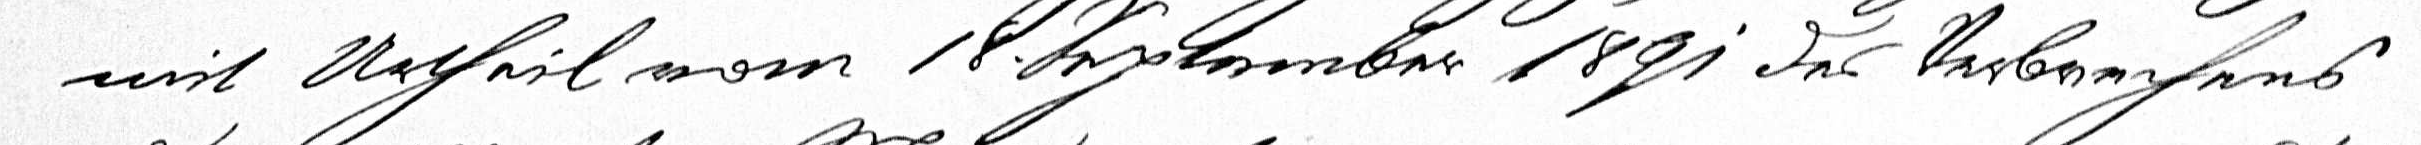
mit Urtheil vom 18 September 1891 des Verbrechens
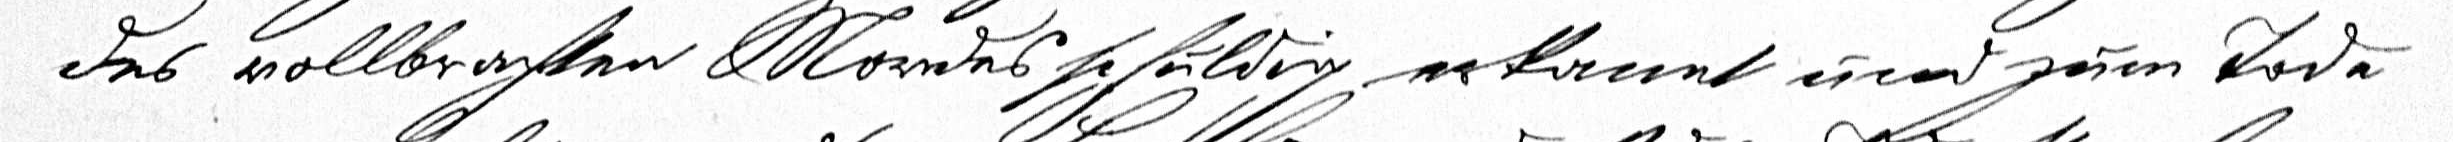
des vollbrachten Mordes schuldig erkannt und zum Tode
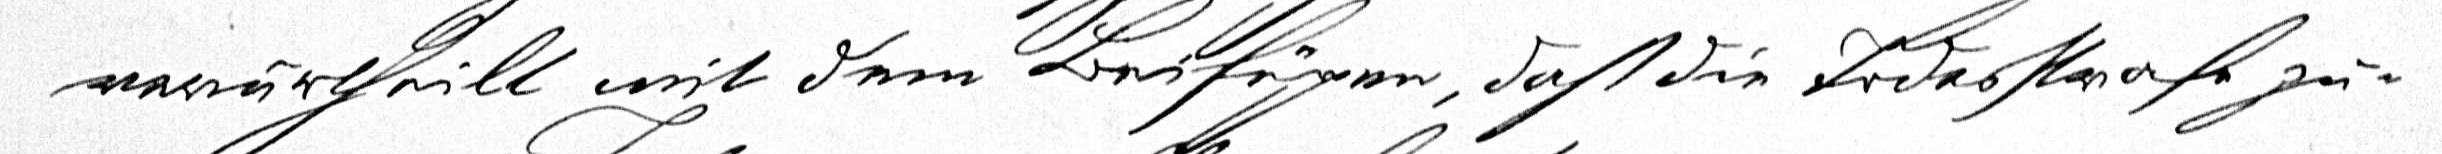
verurtheilt mit dem Beifügen, daß die Todesstrafe zu¬
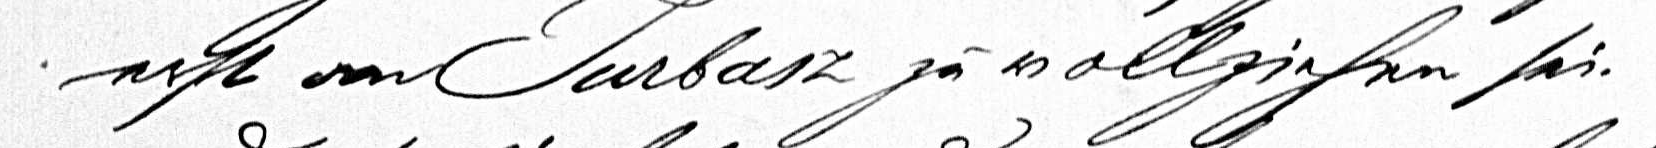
erst an Iurbasz zu vollziehen sei.
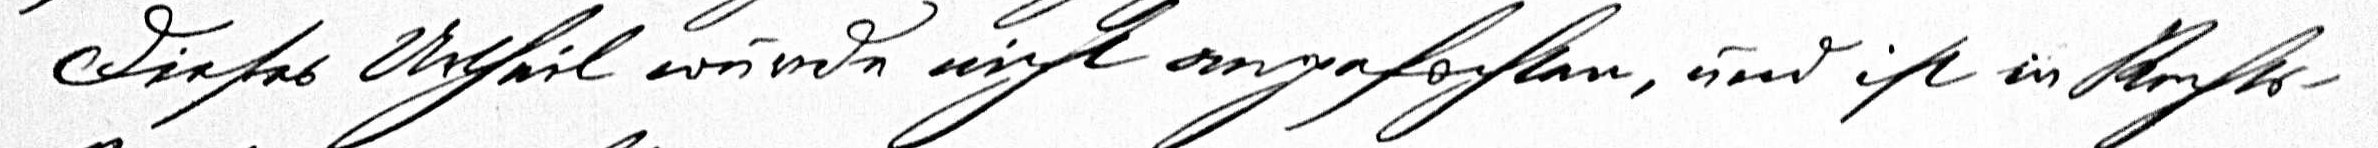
Dieses Urtheil wurde nicht angefochten, und ist in Rechts¬
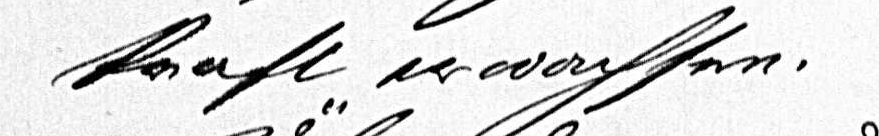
kraft erwachsen.
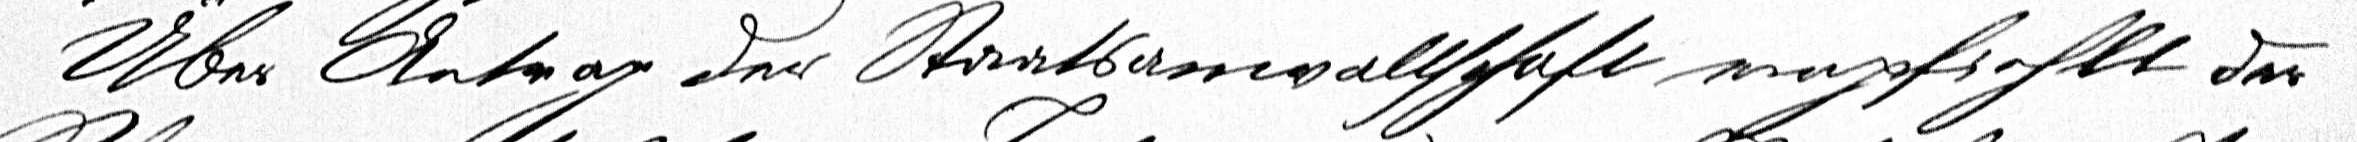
Über Antrag der Staatsanwaltschaft empfiehlt der
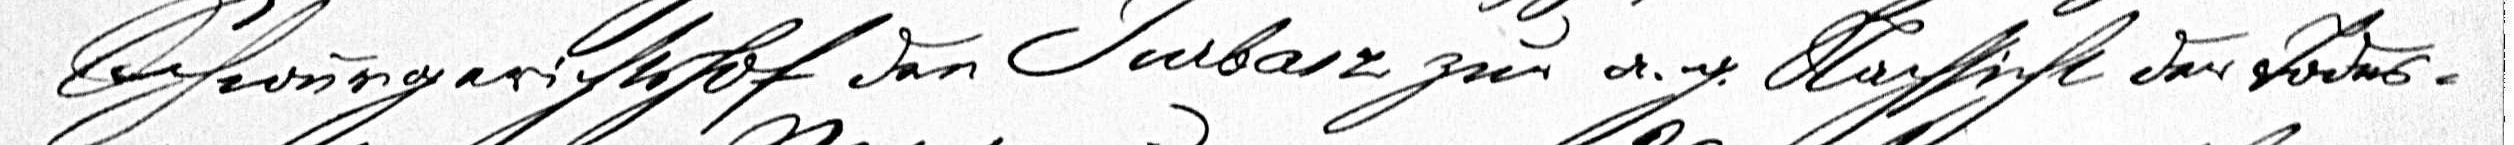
Schwurgerichtshof den Iurbasz zur a.g. Nachsicht der Todes¬
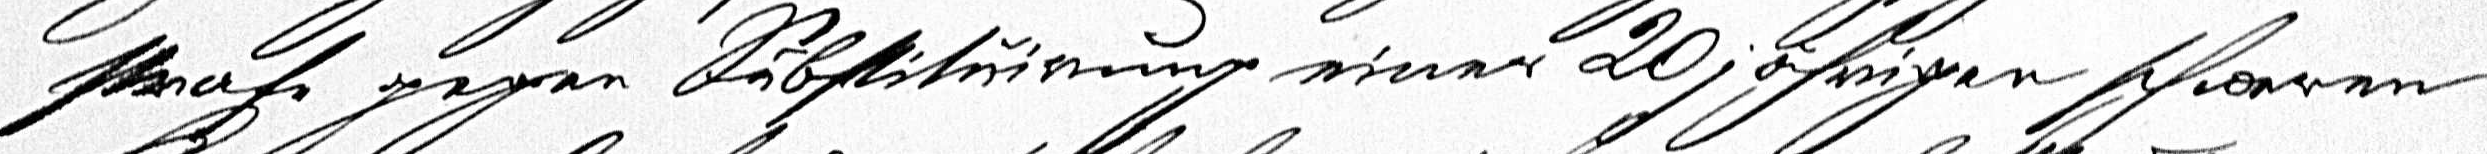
strafe gegen Substituirung einer 20jährigen schweren
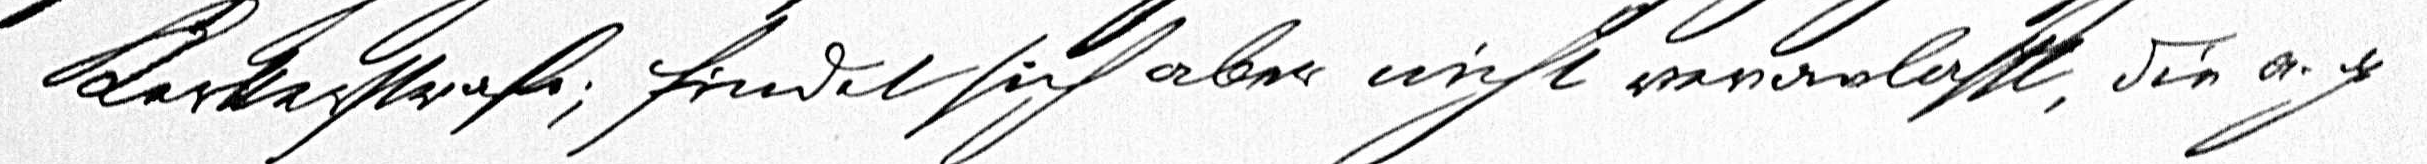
Kerkerstrafe; findet sich aber nicht veranlaßt, die a.g.
